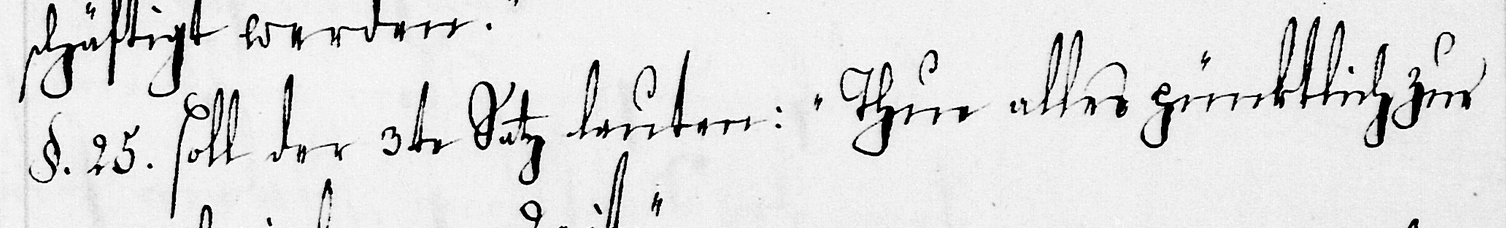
§. 25. soll der 3te Satz lauten: „Thun alles pünktlich zur
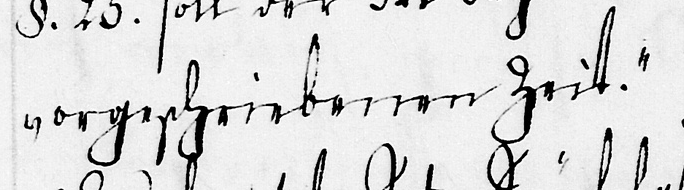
vorgeschriebenen Zeit.“
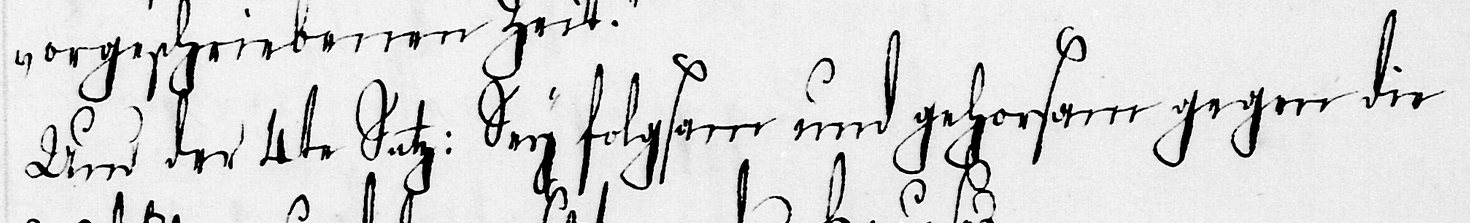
Und der 4te Satz: Sey folgsam und gehorsam gegen die
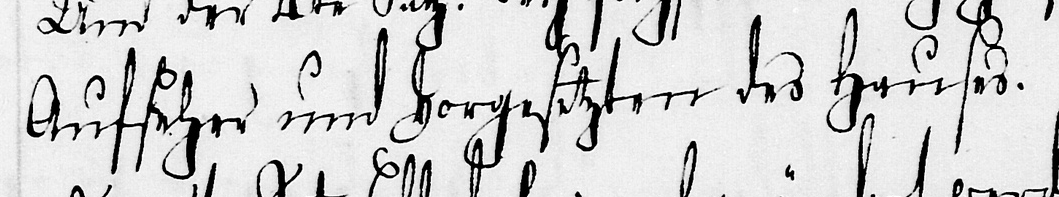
Aufseher und Vorgesetzten des Hauses.
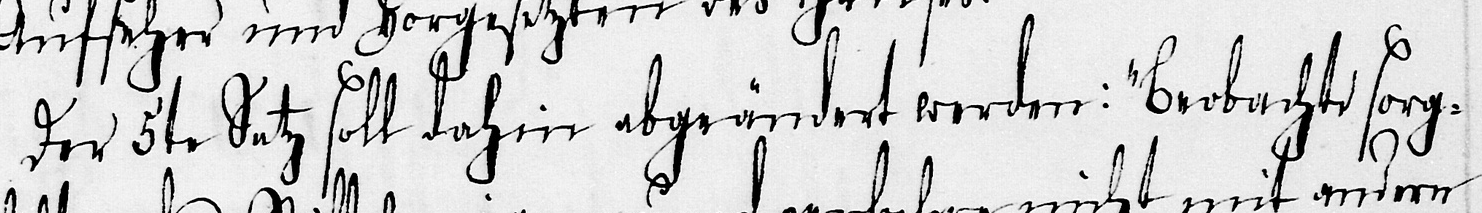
Der 5te Satz soll dahin abgeändert werden: „Beobachte sorg¬
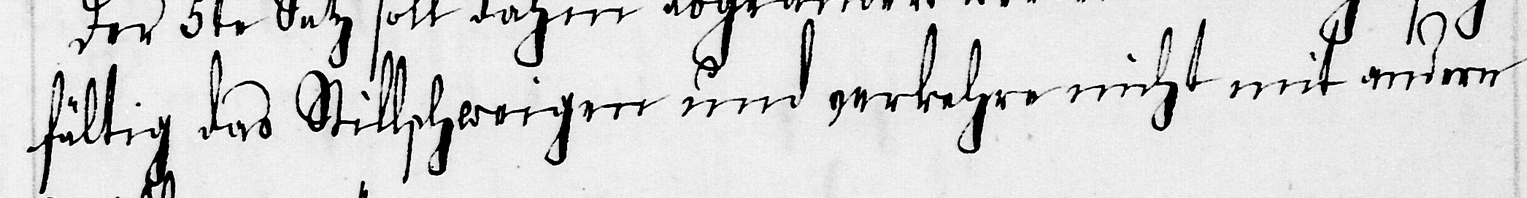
fältig das Stillschweigen und verkehre nicht mit andern
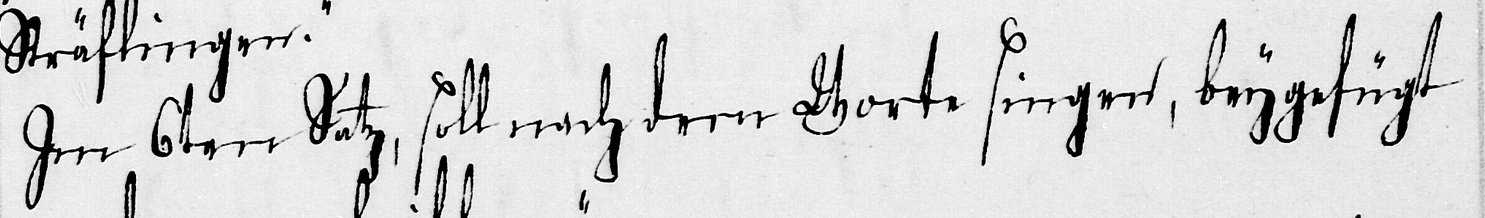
Im 6ten Satz, soll nach dem Worte singen, beygefügt
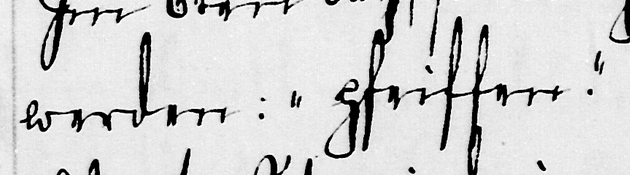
werden: „pfeiffen“.
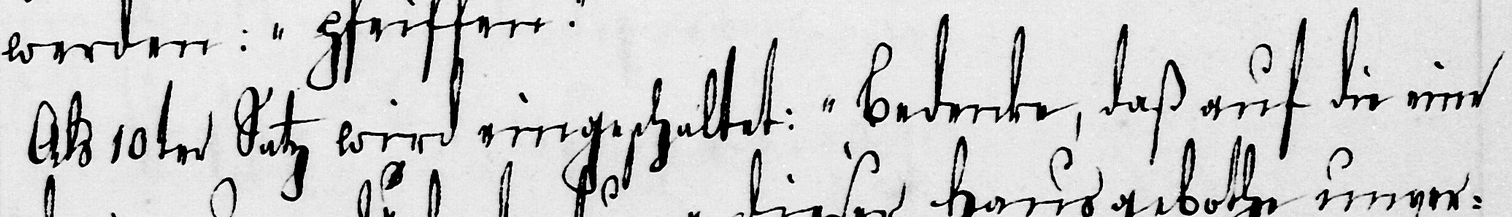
Als 10ter Satz wird eingeschaltet: „Bedenke, daß auf die eine
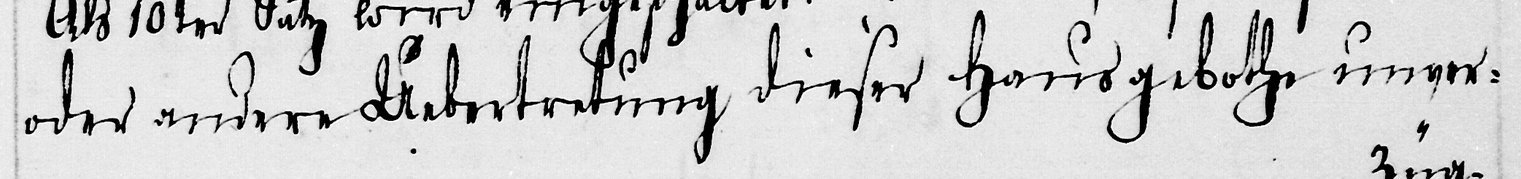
oder andere Uebertretung dieser Hausgebothe unver-
